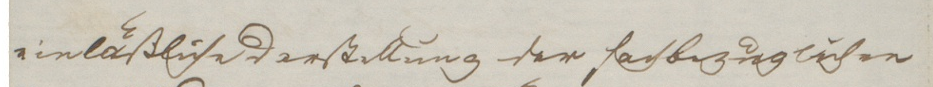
einläßliche Darstellung der sachbezüglichen
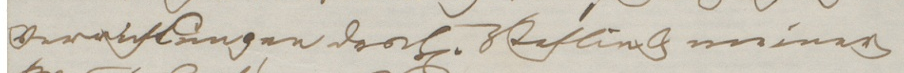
Verrichtungen des H. Stehlin & meiner
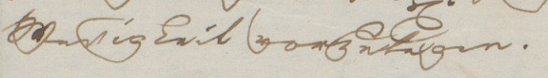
Wenigkeit vorzulegen.
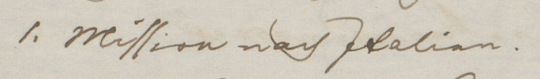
1. Mission nach Italien.
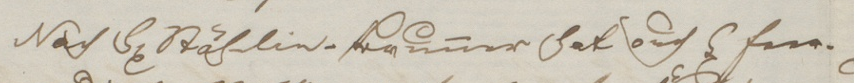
Nach Herr Stählin-Brunner hat auch Herr
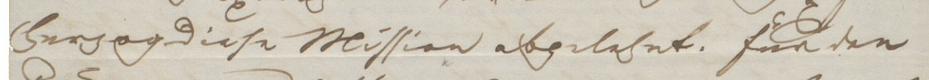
Herzog diese Mission abgelehnt. Für den
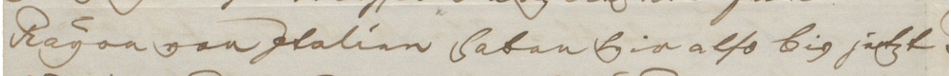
Rayon von Italien haben wir also bis jetzt
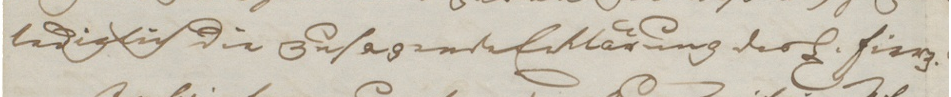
lediglich die zusagende Erklärung des H. Fierz.
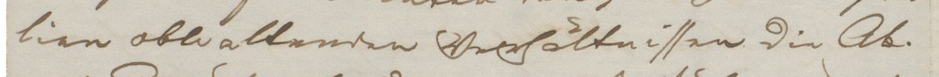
lien obwaltenden Verhältnissen die Ab-
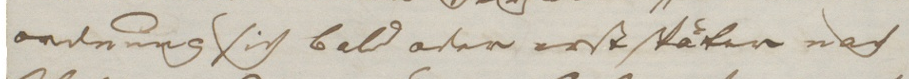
ordnung sich bald oder erst später nach
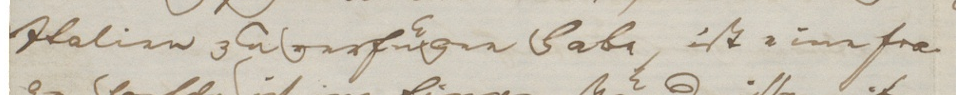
Italien zu verfügen habe, ist eine Fra-
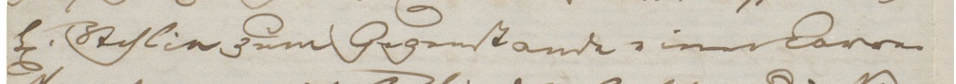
H. Stehlin zum Gegenstande einer Corre-
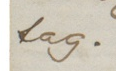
tag.
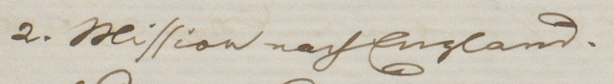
2. Mission nach England.
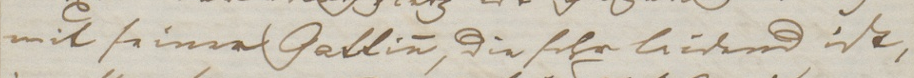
mit seiner Gattinn , die sehr leidend ist,
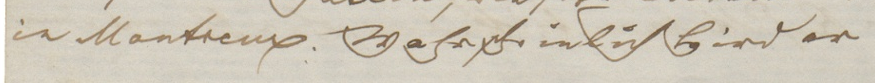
in Montreux. Wahrscheinlich wird er
